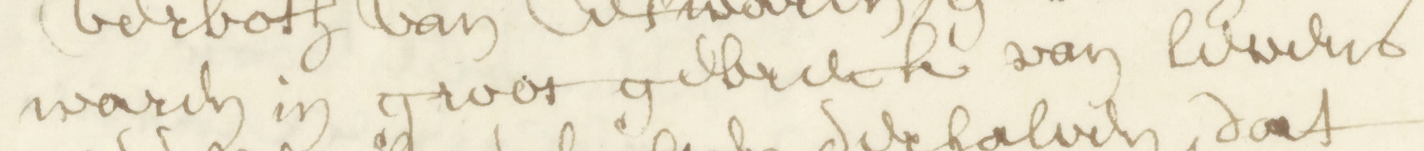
waren in groot gebreck van levens
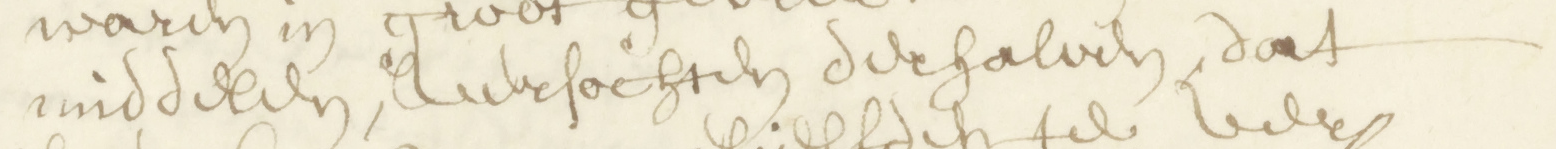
middelen, versochten derhalven, dat
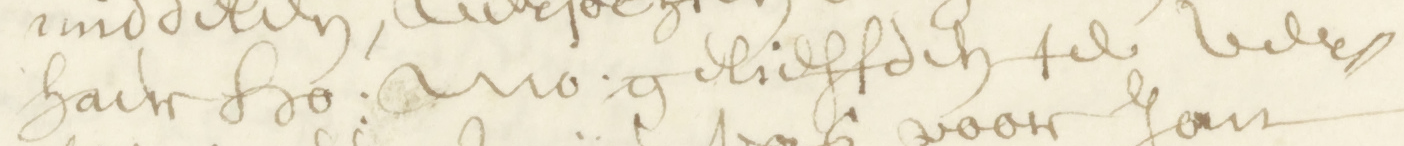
haer Ho:Mo: gelieffden te ver„
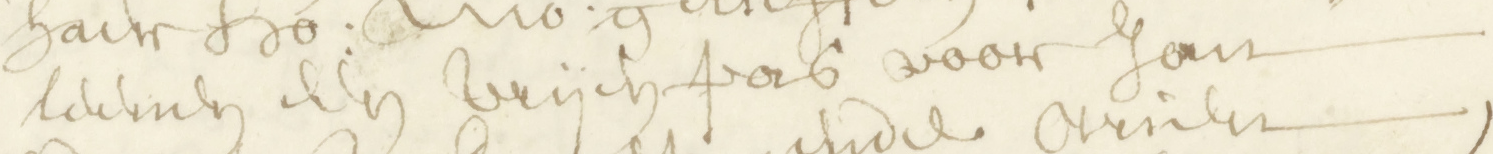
leenen een vrijen pas voor Jan
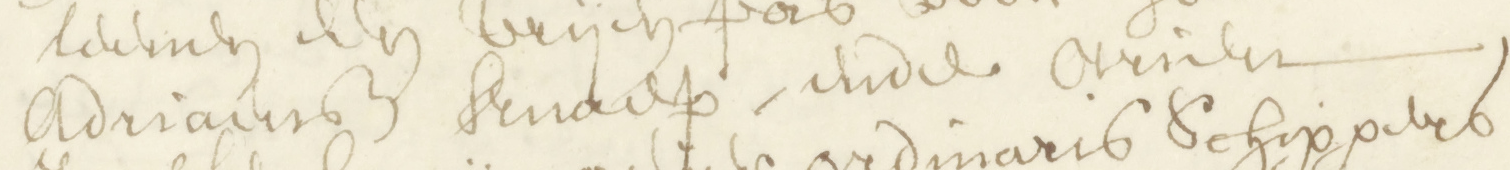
Adriaens Knaep, ende Arien
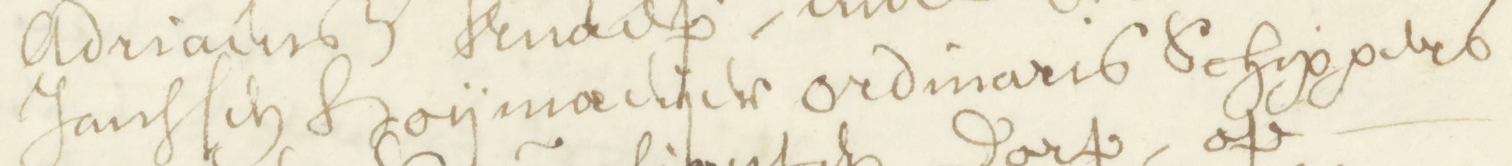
Janssen Hoijmaeijer ordinaris Schippers
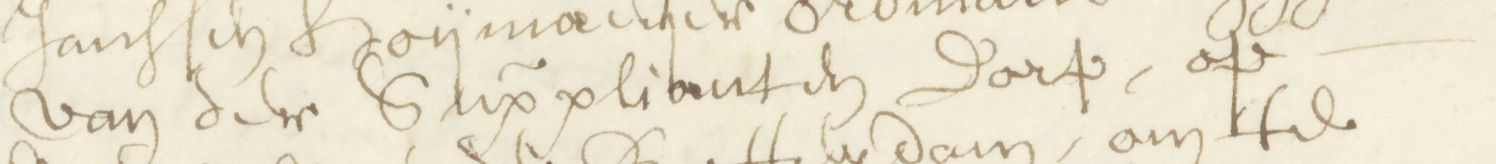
van der Supplianten Dorp, op
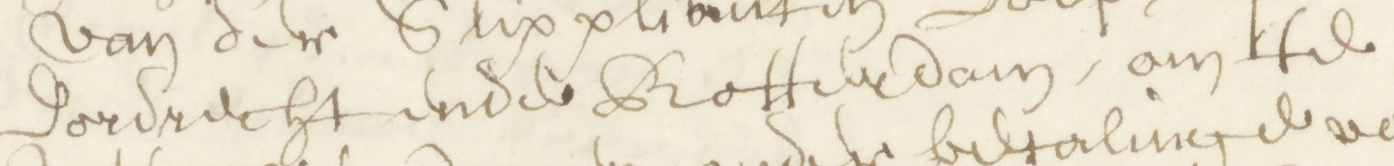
Dordrecht ende Rotterdam, om te
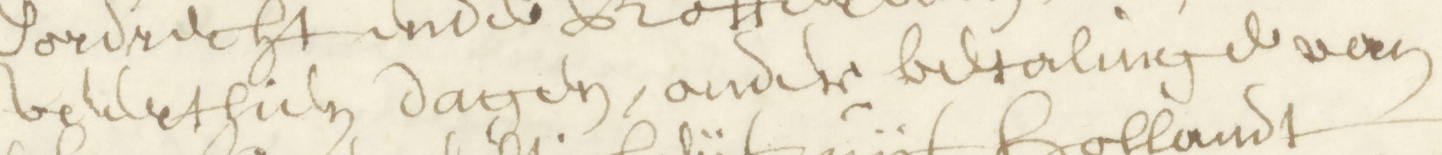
veerthien dagen, onder betalinge van
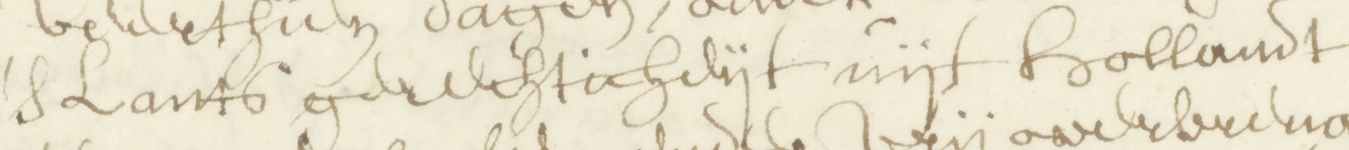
's Lants gerechticheijt uijt Hollandt
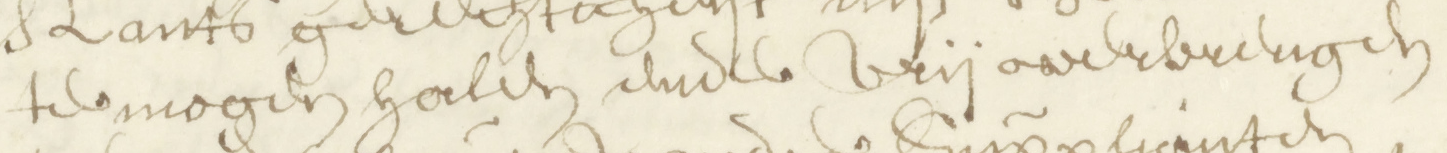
te mogen halen ende vrij overbrengen
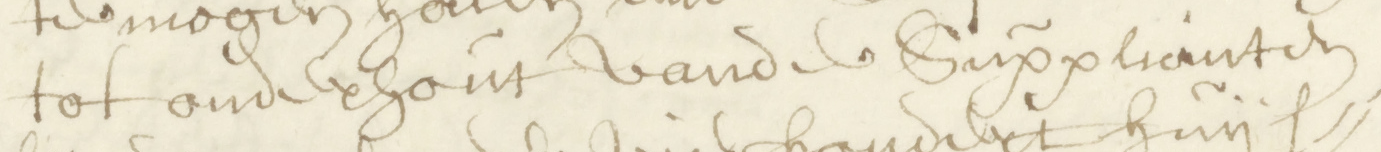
tot onderhout vande Supplianten
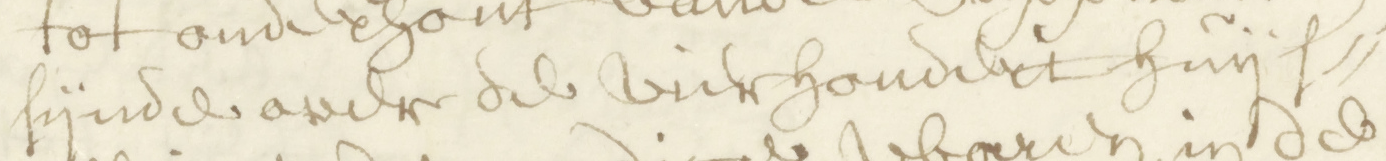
sijnde over de vierhondert huijs„
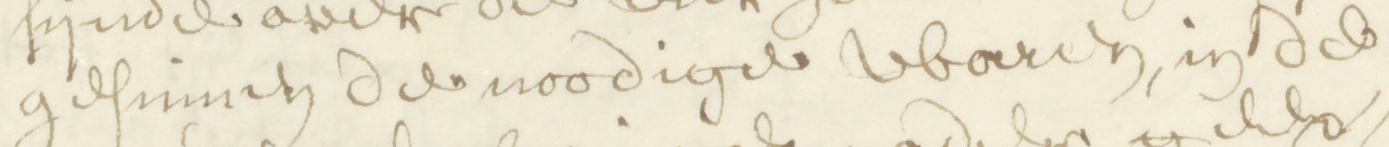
gesinnen de noodige waren, in de
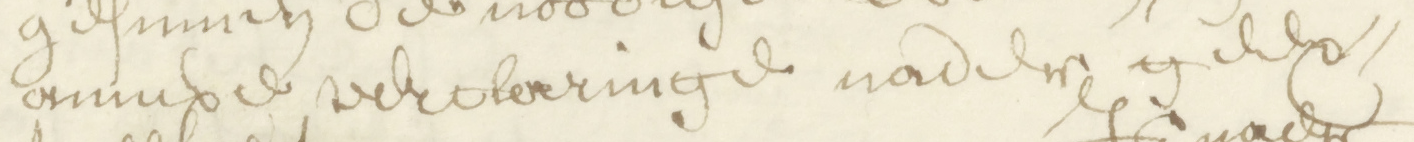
annexe verclaringe nader geex„
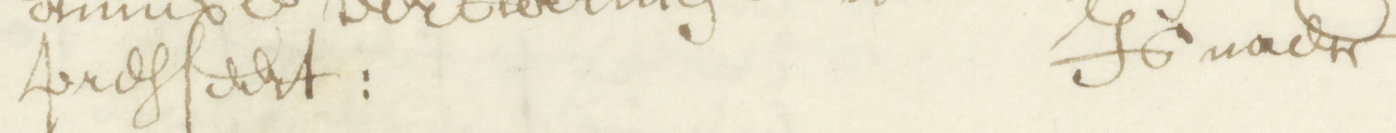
presseert: Is naer
